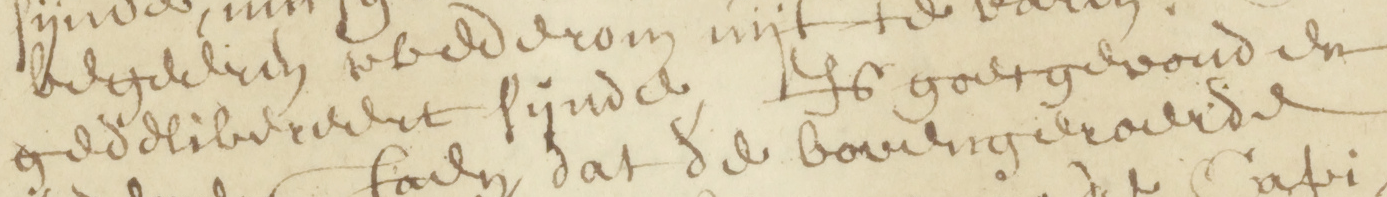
gedelibereert sijnde, Is goetgevonden
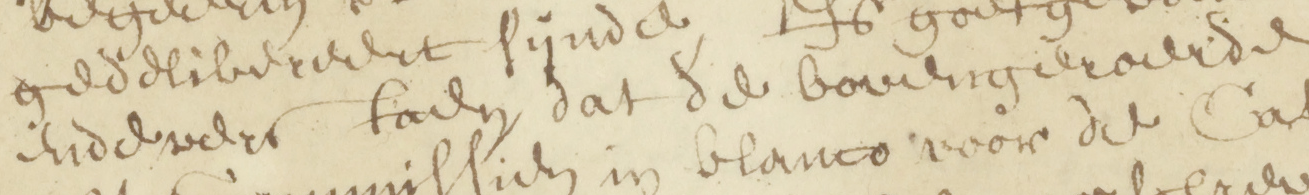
ende verstaen, dat de bovengeroerde
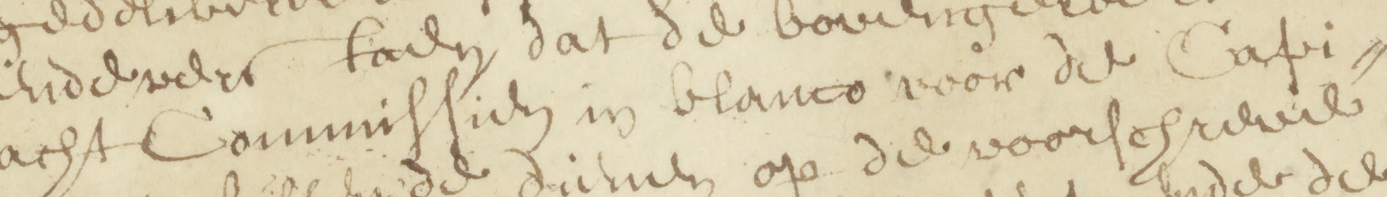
acht Commissien in blanco voor de Capi„
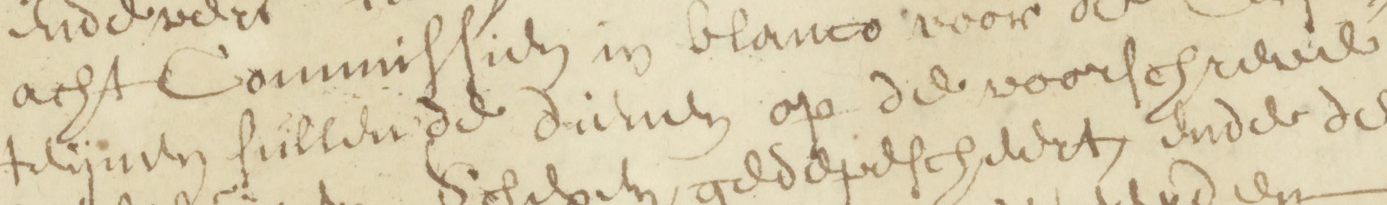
teijnen sullende dienen op de voorschreve
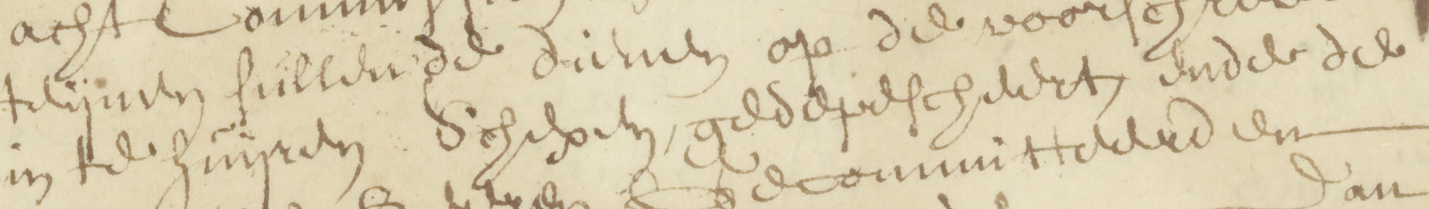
in te huijren Schepen, gedepescheert, ende de
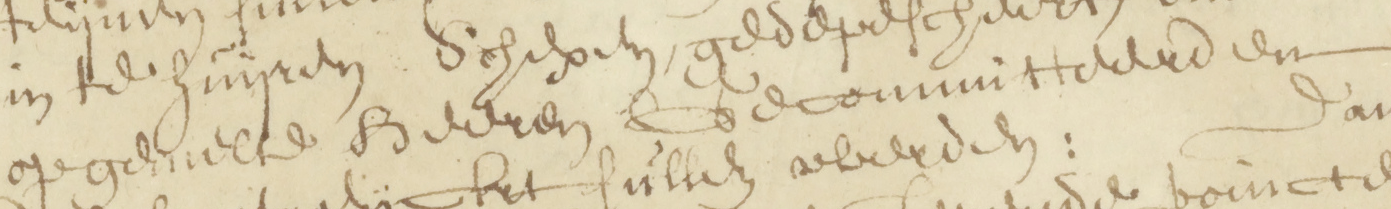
opgemelte Heeren Gecommitteerden
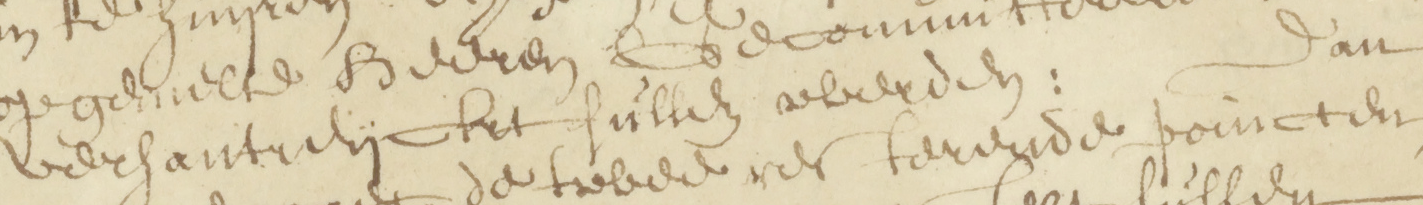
verhantreijckt sullen werden: Dan
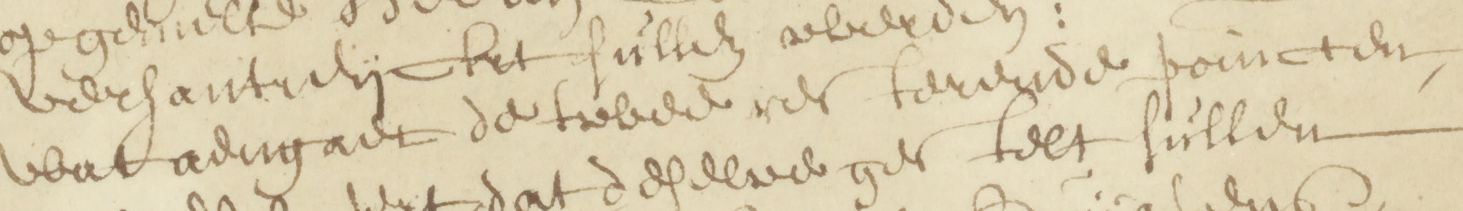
wat aengaet de twee resterende poincten,
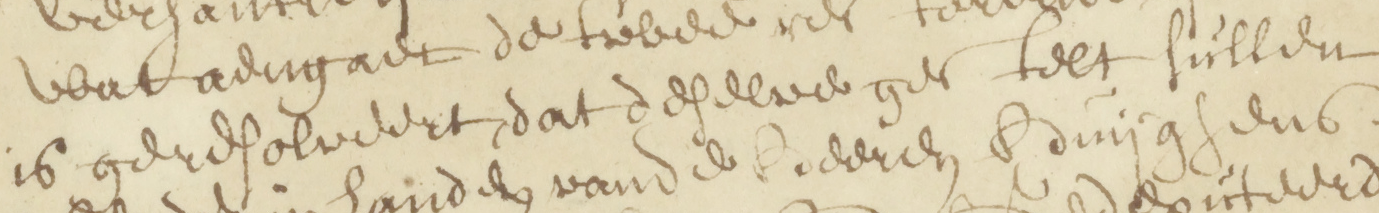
is geresolveert, dat deselve gestelt sullen
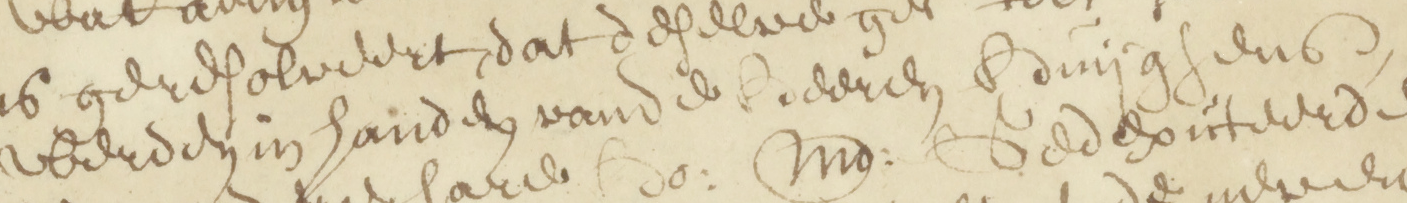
werden in handen vande Heeren Huijghens,
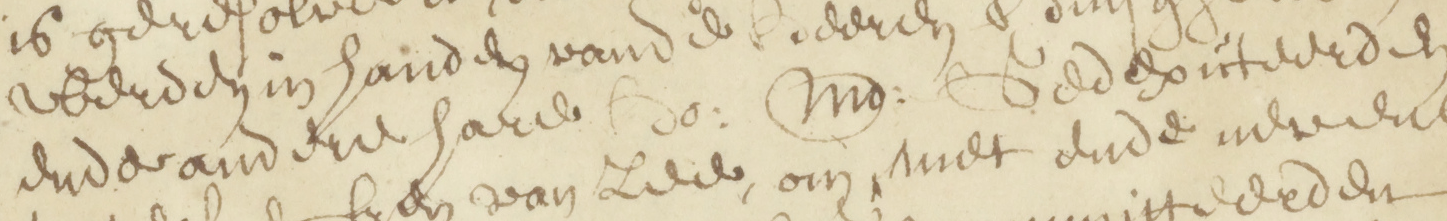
ende andere hare Ho:Mo: Gedeputeerden
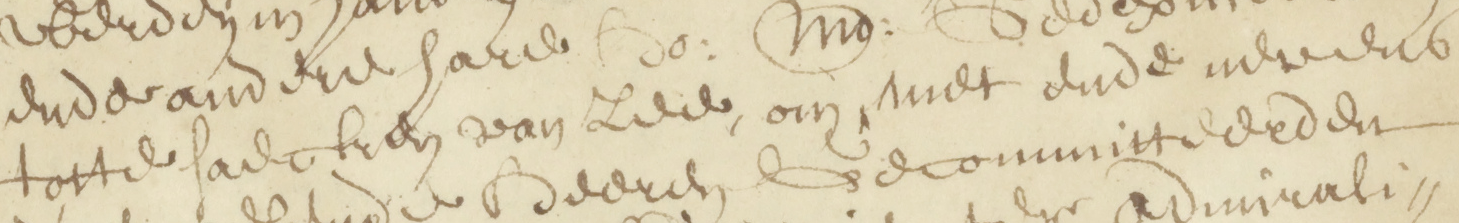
totte saecken van Zee, om met ende nevens
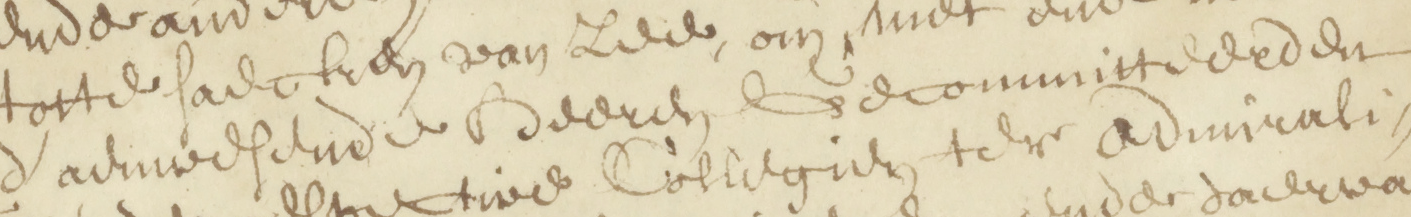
d‛aenwesende Heeren Gecommitteerden
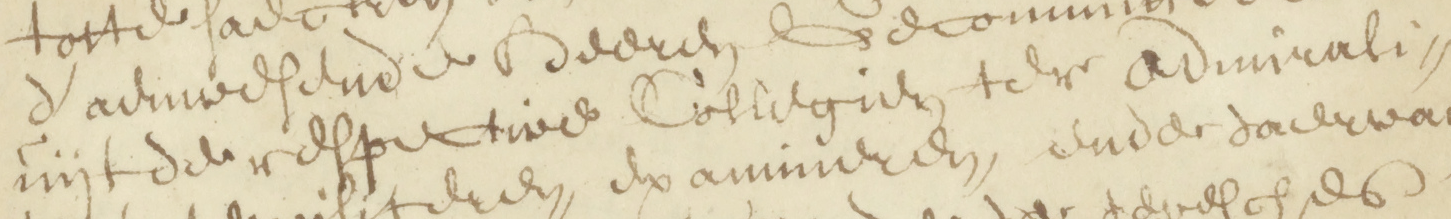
uijt de respective Collegien ter Admirali„
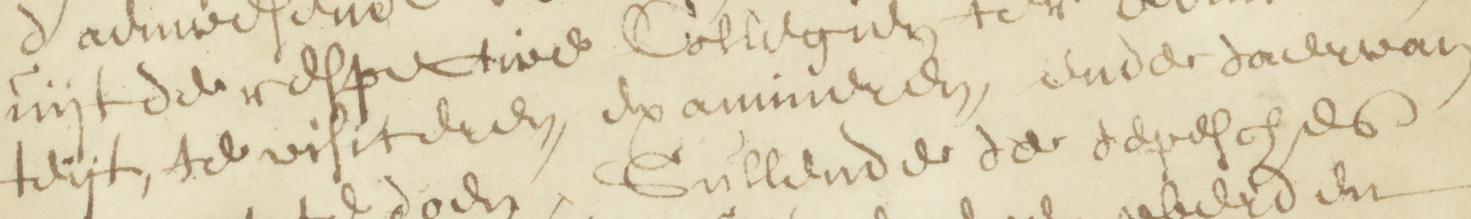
teijt, te visiteren, examineren, ende daervan
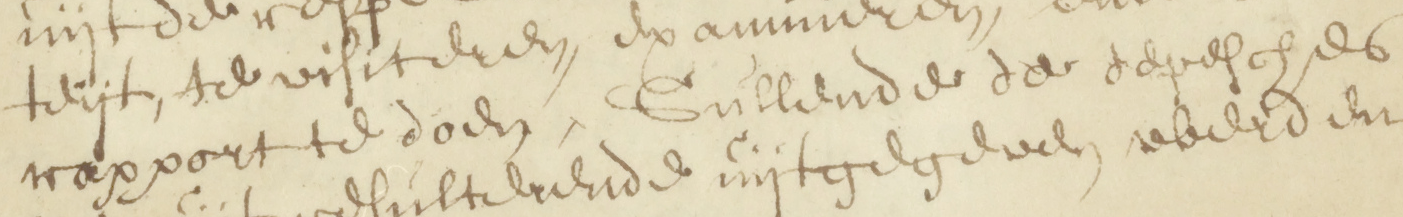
rapport te doen. Sullende de depesches
